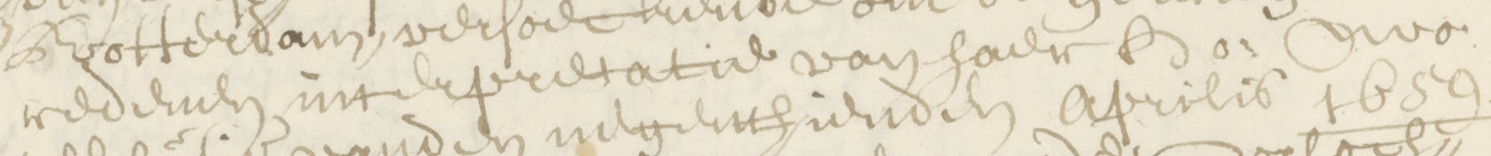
redenen interpretatie van haer Ho:Mo:
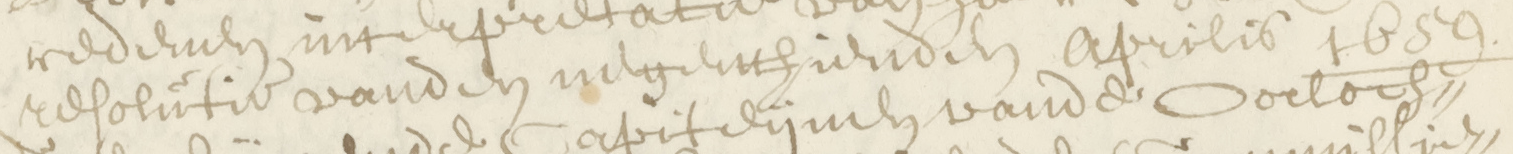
resolutie vanden negenthienden Aprilis 1659
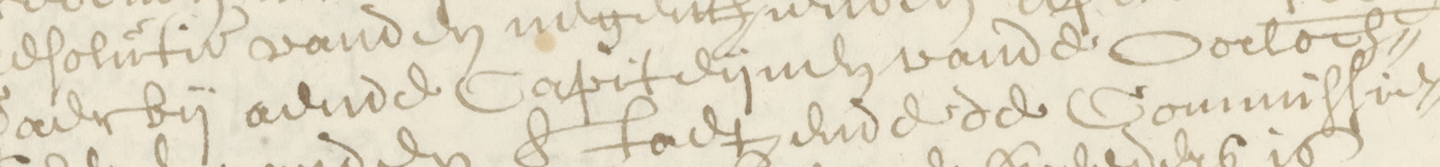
daerbij aende Capiteijnen vande Oorloch,,
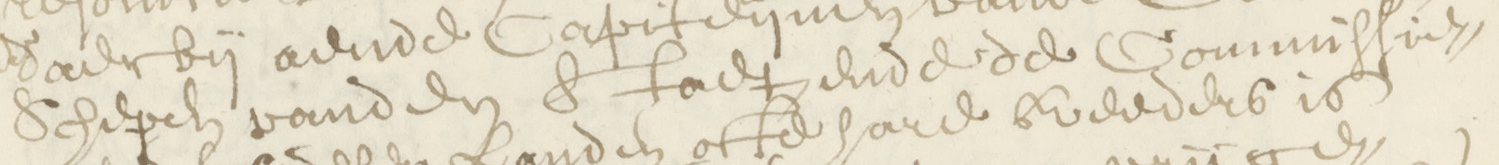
Schepen vanden Staet, ende de Commissie,,
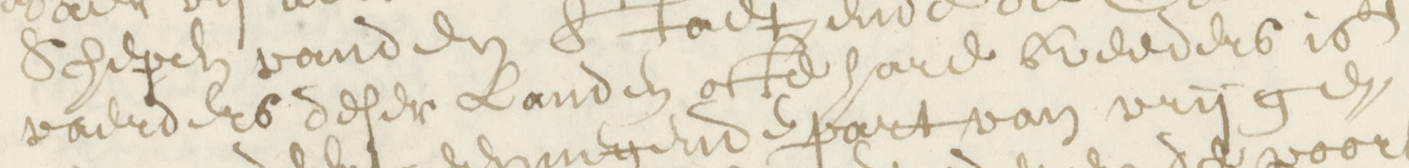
vaerders deser Landen ofte hare Reeders is
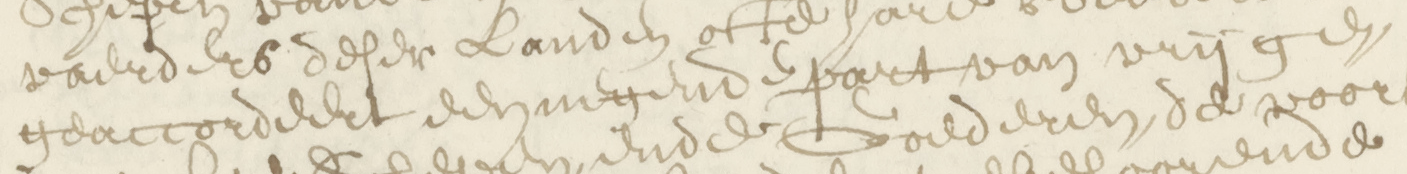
geaccordeert een negende part van vrij ge,,
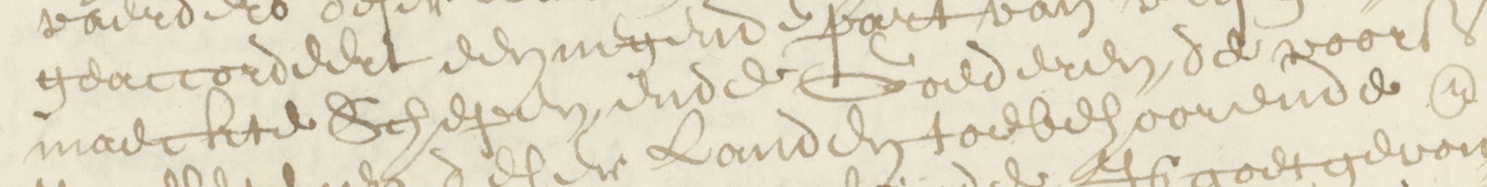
maeckte Schepen, ende Goederen, de voors
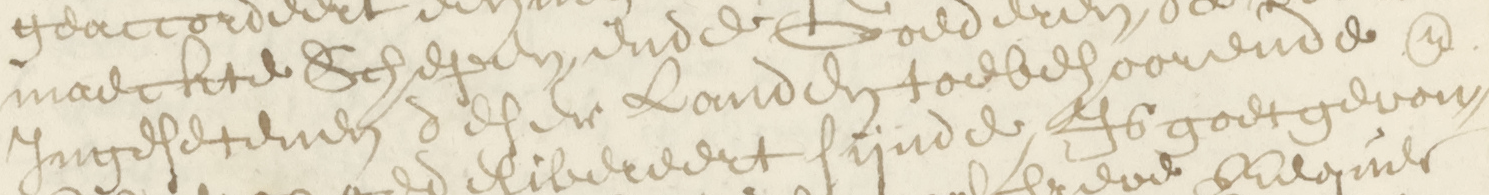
Ingesetenen deser Landen toebehoorende @
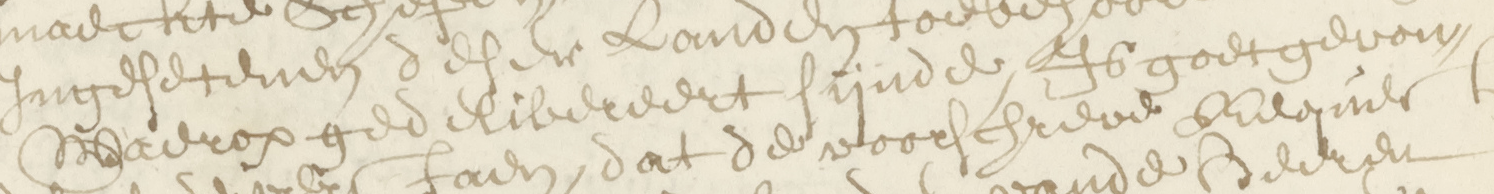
Waerop gedelibereert sijnde, Is goetgevon„
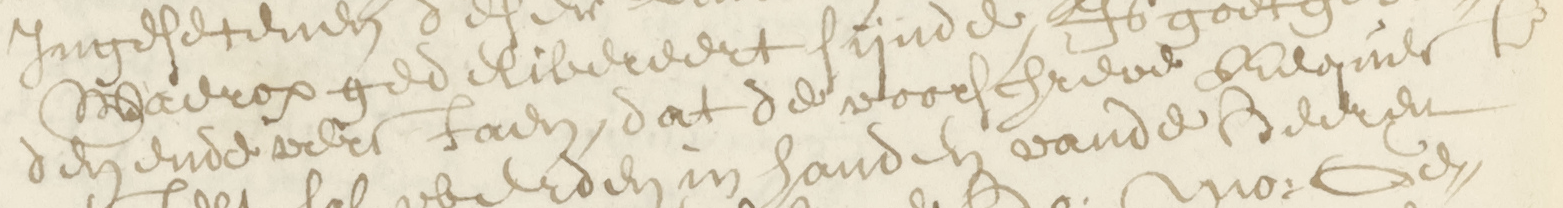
den ende verstaen, dat de voorschreve Requeste
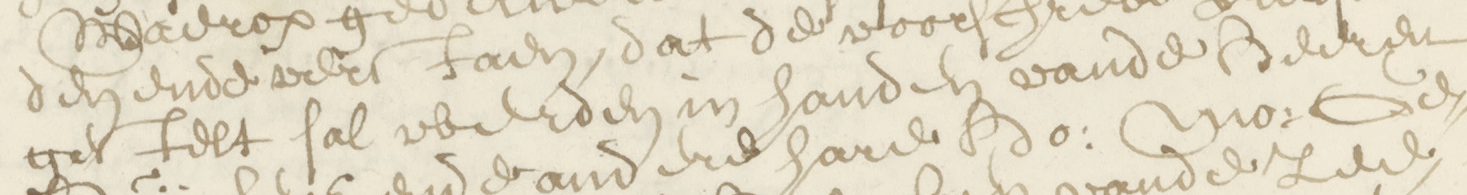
gestelt sal werden in handen vande Heeren
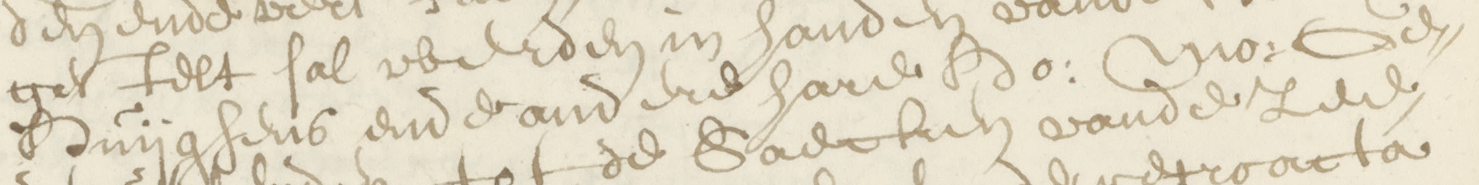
Huijghens ende andere hare Ho:Mo: Ge,,
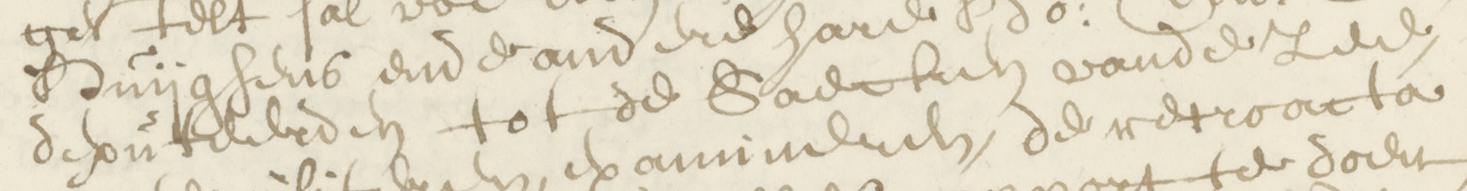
deputeerden tot de Saecken vande Zee
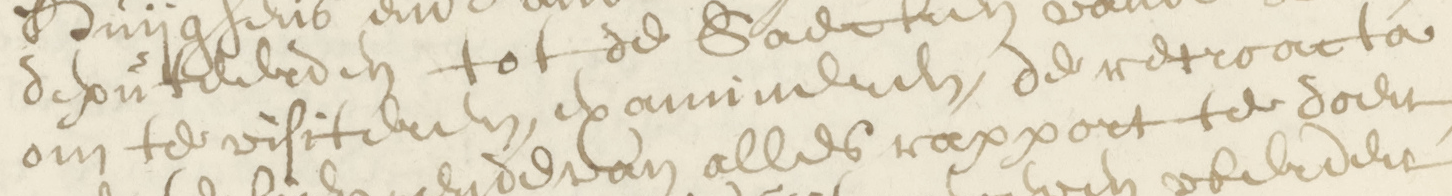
om te visiteren, examineren, de retroacta
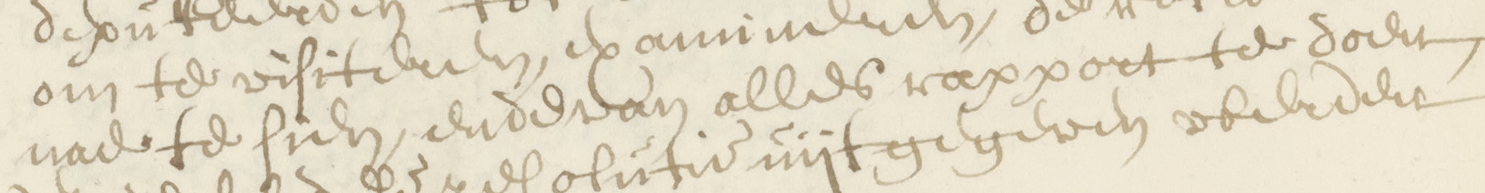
nae te sien, ende van alles rapport te doen.
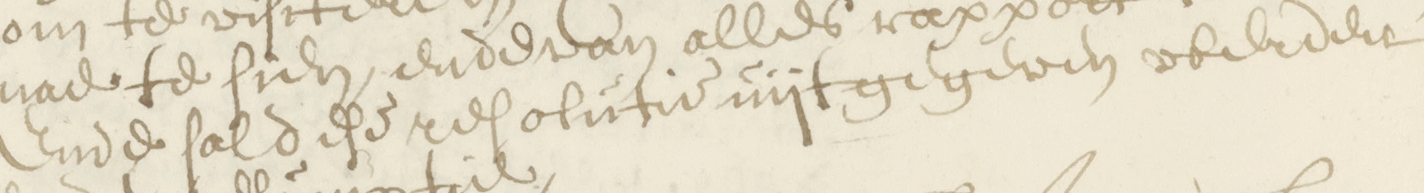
Ende sal dese resolutie uijtgegeven werden
